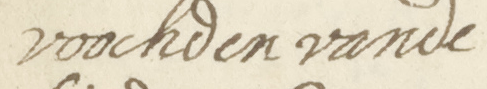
voochden vande
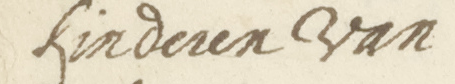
kinderen van
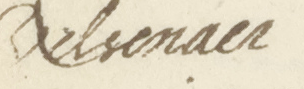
Velsenaer
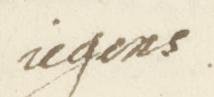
iegens
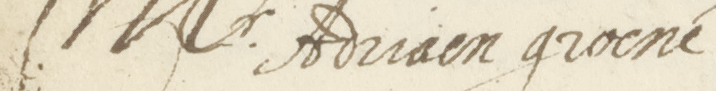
Mr. Adriaen groene
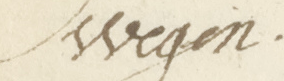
wegen.
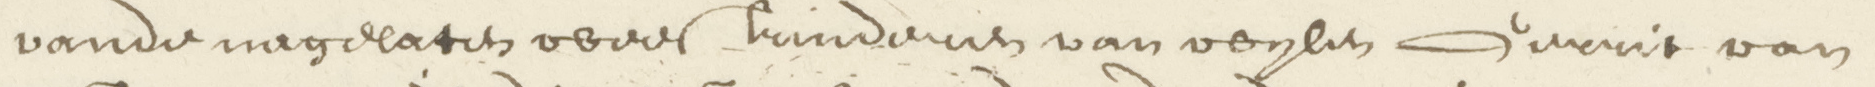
vande nagelaten weeskinderen van wylen Gerrit van
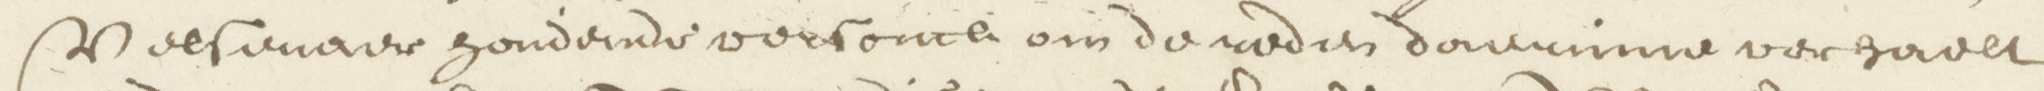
Velsenaer houdende versouck om de reden daerinne verhaelt
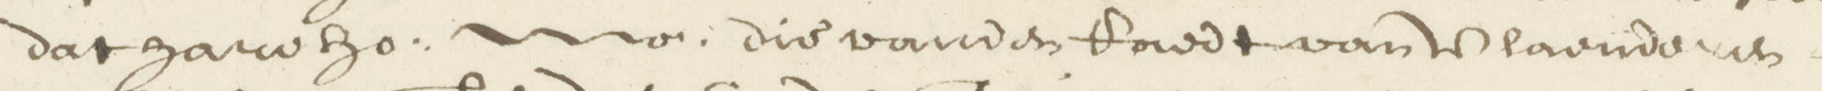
dat hare Ho:Mo: die vanden Raedt van Vlaenderen
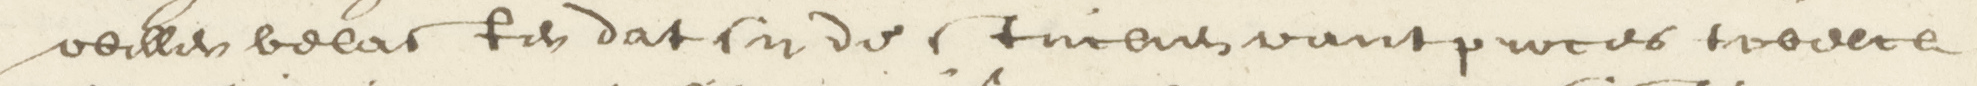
willen belasten dat sy de stucken vant proces twelck
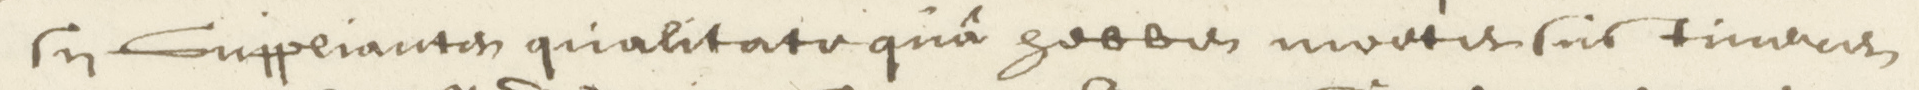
sy Supplianten qualitate quâ hebben moeten sustineren
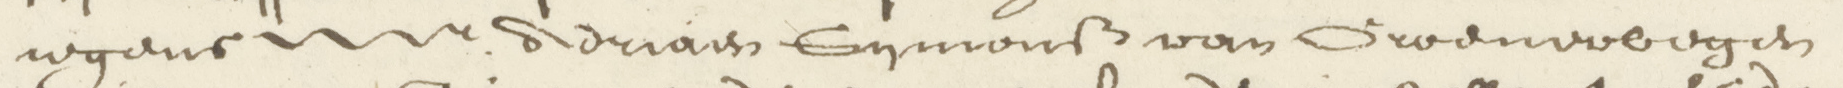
iegens Mr. Adriaen Symons van Groenewegen
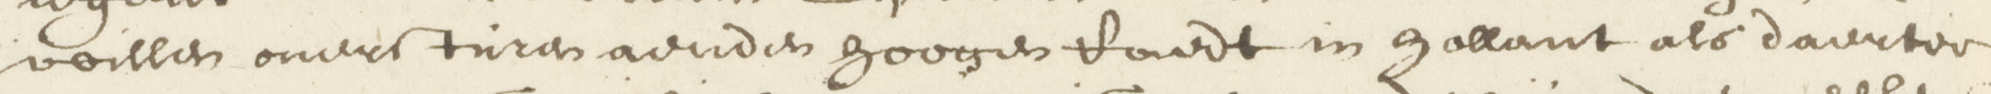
willen ouersturen aen den hoogen Raedt in hollant als daertoe
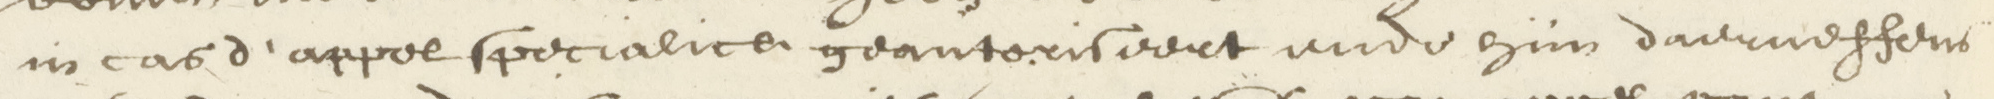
in cas d'appel specialick geautoriseert ende hun daerneffens
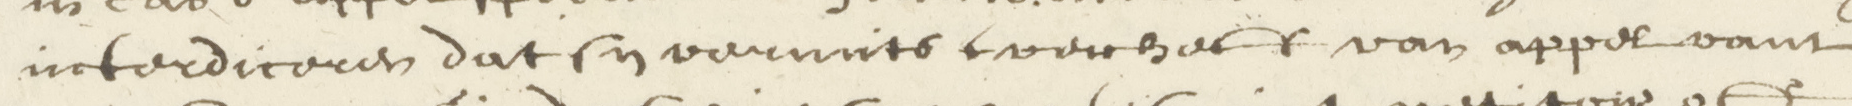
interdiceren dat sy vermits tverheff van appel vant
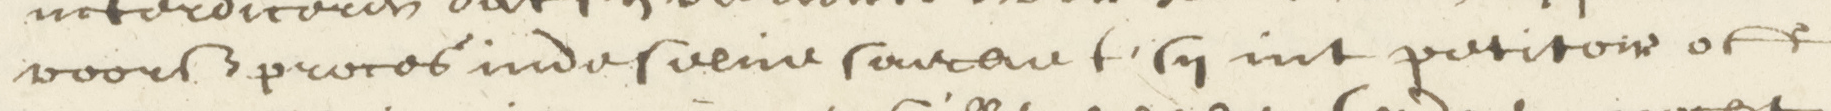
voors proces inde selue saecke t' sy int petitoir off
